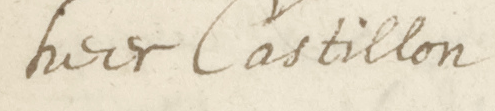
heer Castillon
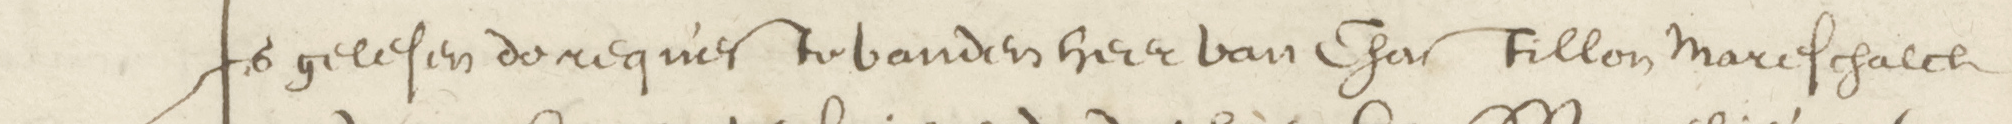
Is gelesen de requeste vanden heer van Chastillon Mareschalck
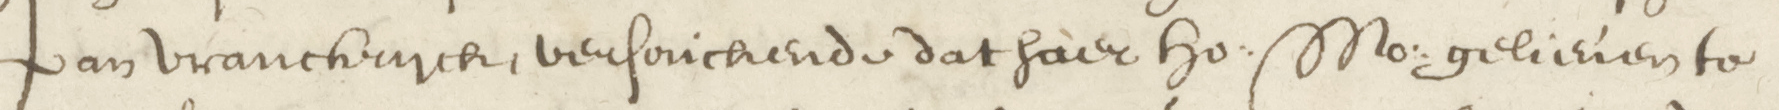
van Vranckryck, versouckende dat haer Ho:Mo: gelieuen te
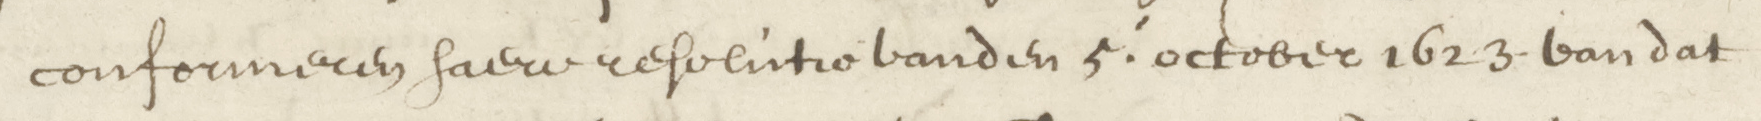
conformeren haere resolutie vanden 5e. october 1623 van dat
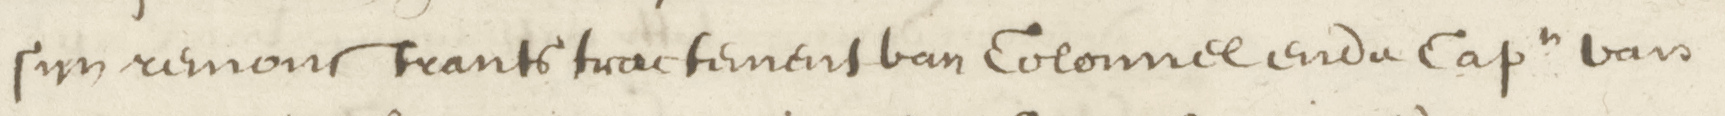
syn remonstrants tractement van Colonnel ende Capn. van
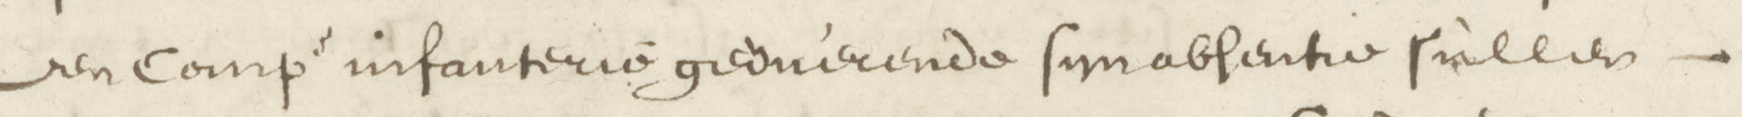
een Compe infanterie geduerende syn absentie sullen
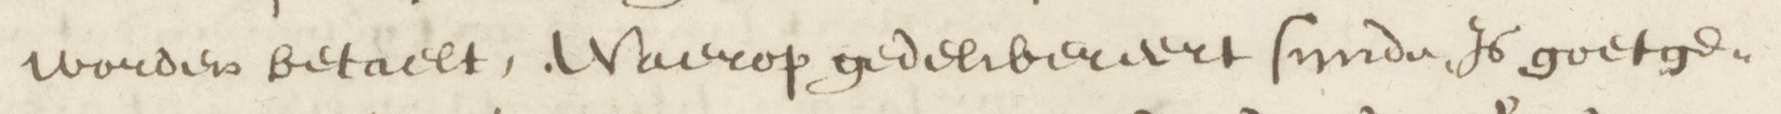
worden betaelt. Waerop gedelibereert synde, Is goetge„
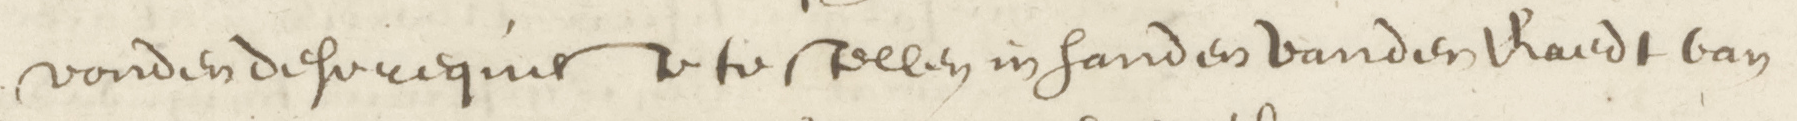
vonden dese requeste te stellen in handen vanden Raedt van
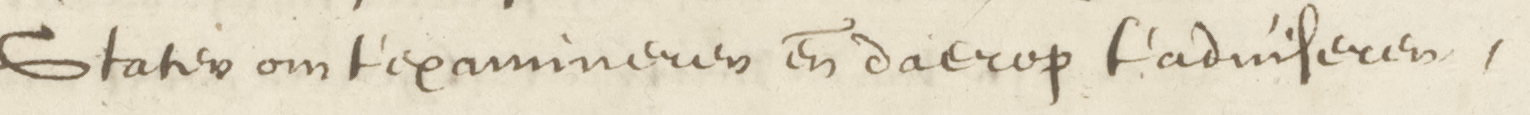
Staten om t'examineren en daerop t'aduiseren.
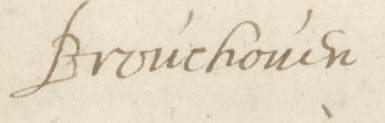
Brouchouen
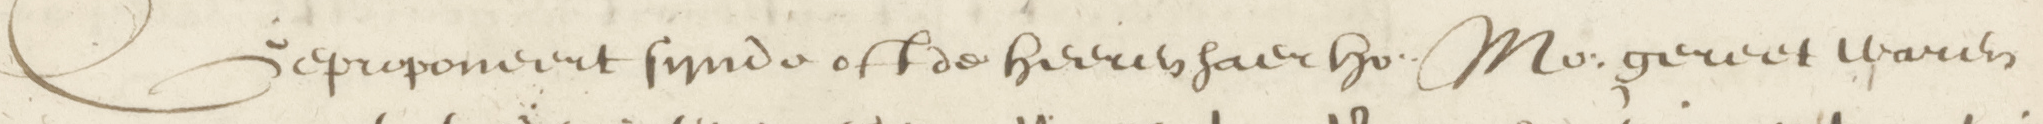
Geproponeert synde off de heeren haer ho:Mo: gereet waren
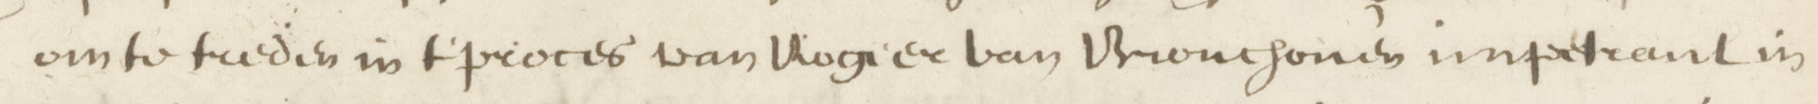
om te treden in t'proces van Rogier van Brouchouen impetrant in
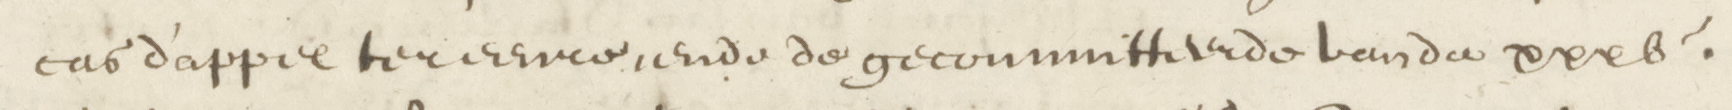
cas d‛appel ter eenre, ende de gecommitteerde vande xxxve.
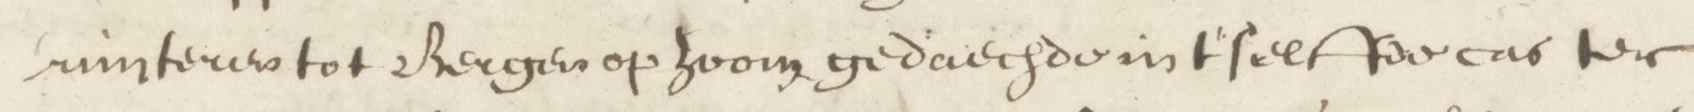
ruyteren tot Bergen op Zoom gedaechde in t'selffde cas ter
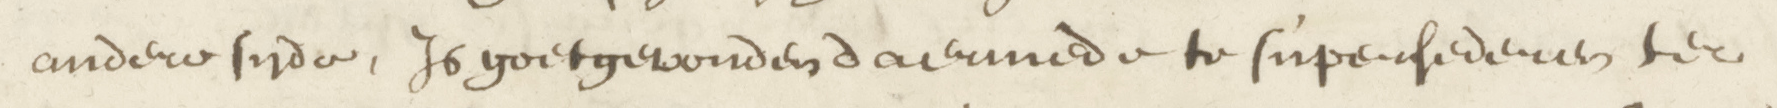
andere syde, Is goetgevonden daermede te supersederen ter
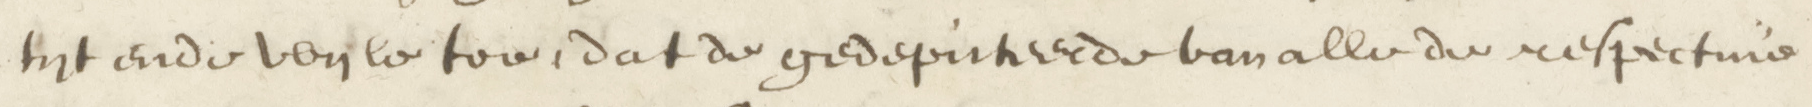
tyt ende wyle toe, dat de gedeputeerde van alle de respectiue
